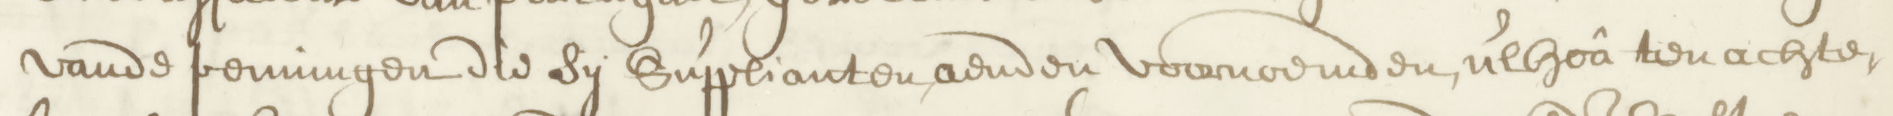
vande penningen die sij Supplianten aenden voornoemden ulhoâ ten achte„
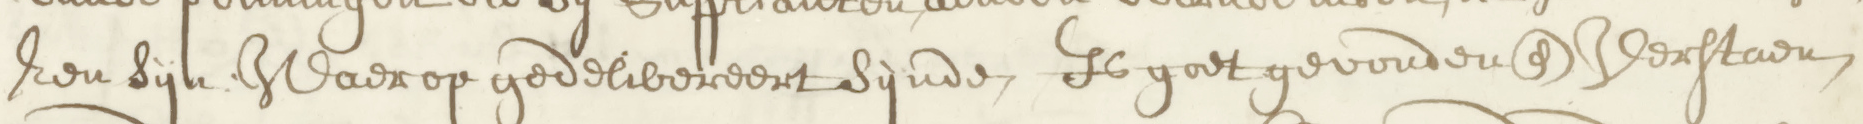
ren sijn: Waerop gedelibereert sijnde, Is goetgevonden & Verstaen,
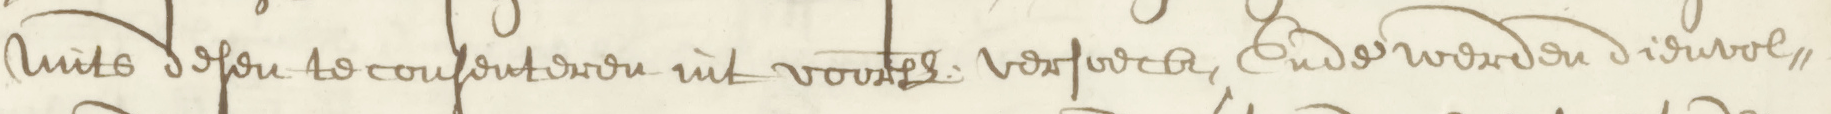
mits desen te consenteren int voors. versoeck, Ende werden dienvol„
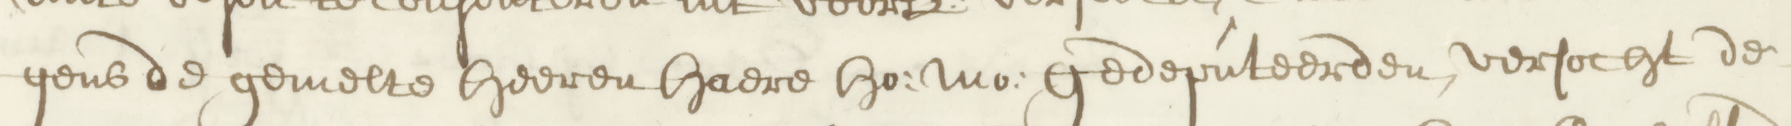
gens de gemelte heeren haere Ho:Mo: gedeputeerden versocht de
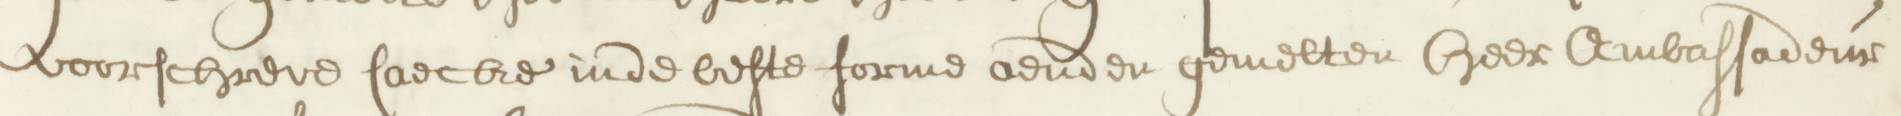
voorschreve saecke inde beste forme aenden gemelten Heer Ambassadeur
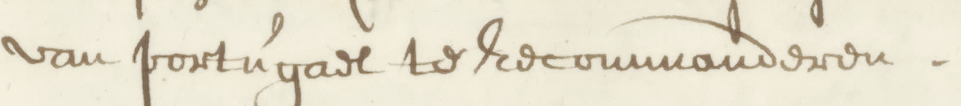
van portugael te recommanderen.
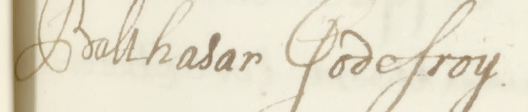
Balthasar Godefroy.
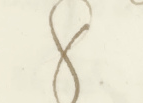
Ca.
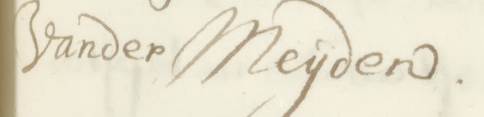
Vander Meijden.
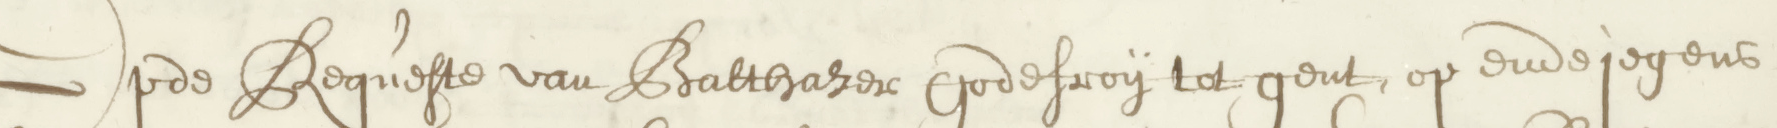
Opde Requeste van Balthaser Godefroij tot Gent, op ende jegens
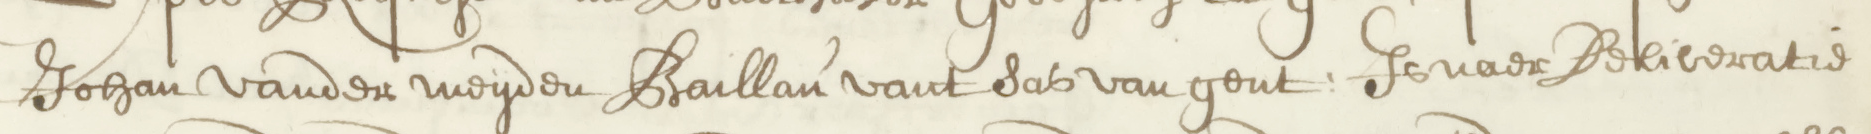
Johan vander Meijden Baillau vant Sas van gent: Is naer Deliberatie
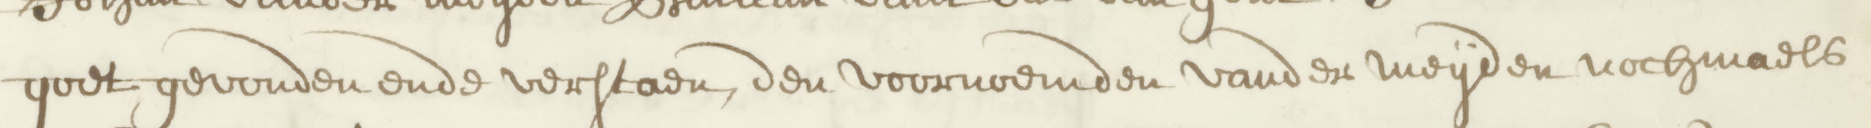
goetgevonden ende verstaen, den voornoemden vander Meijden nochmaels
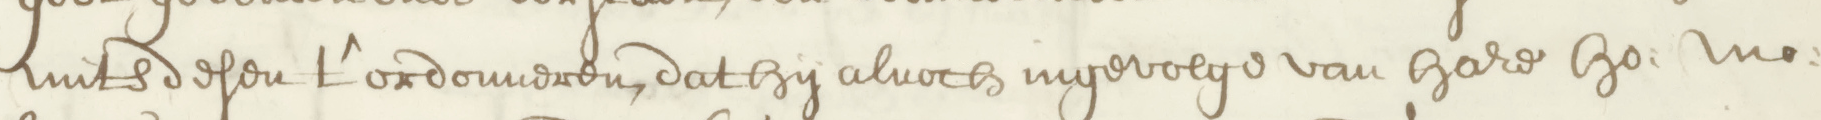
mits desen t' ordonneren dat hij alnoch ingevolge van hare Ho:Mo:
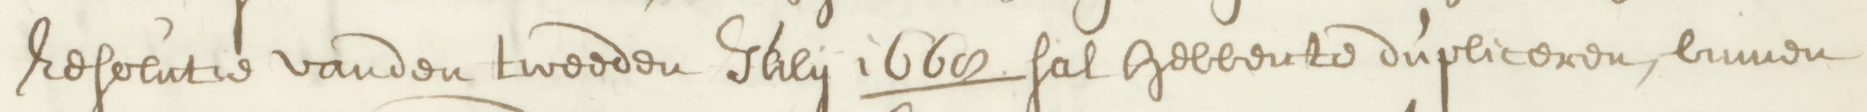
resolutie vanden tweeden Julij 1668 sal hebben te dupliceren, binnen
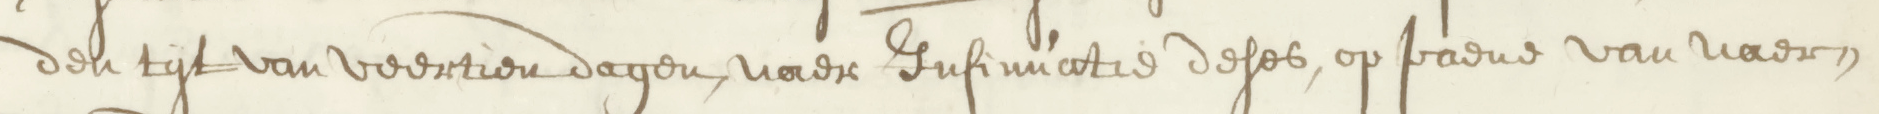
den tijt van veertien dagen, naer Insinuatie deses, op paene van naer„
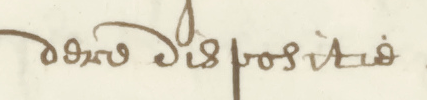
dere dispositie.
